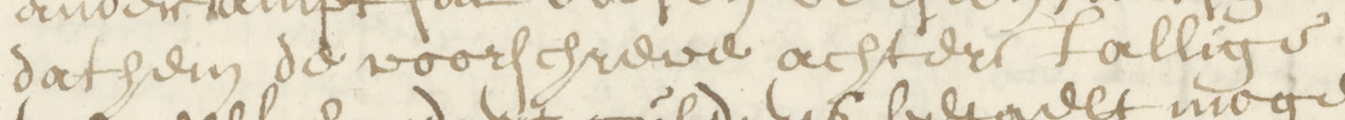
dat hem de voorschreve achterstallige
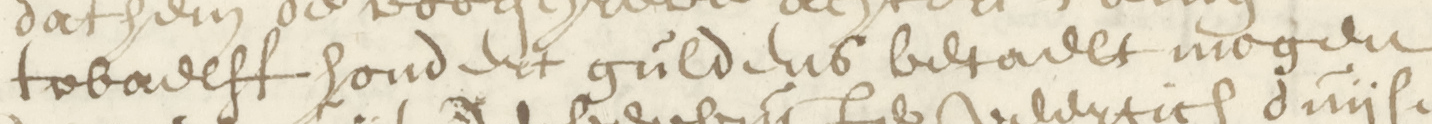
twaelff hondert guldens betaelt mogen
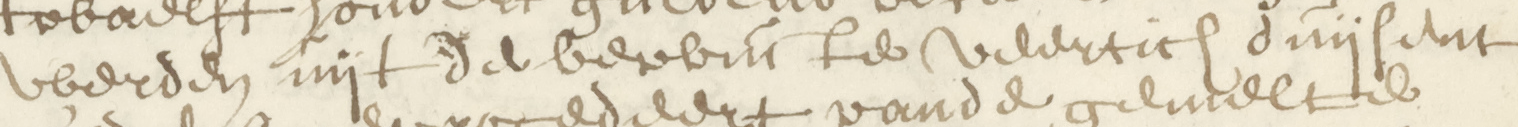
werden uijt de bewuste veertich duijsent
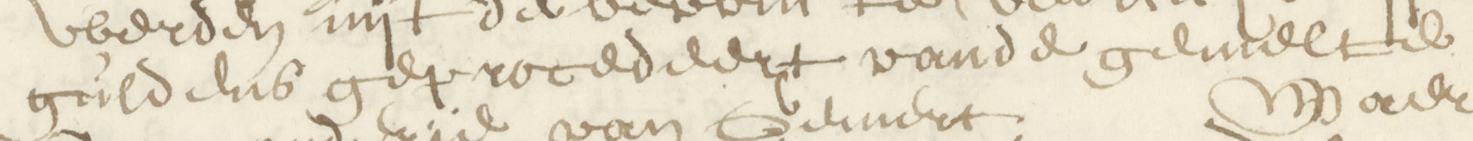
guldens geprocedeert vande gemelte
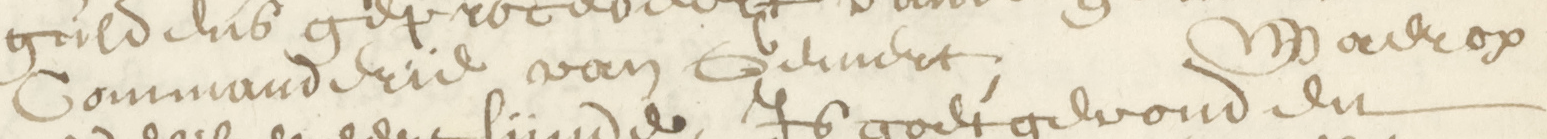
Commanderie van Gemert; Waerop
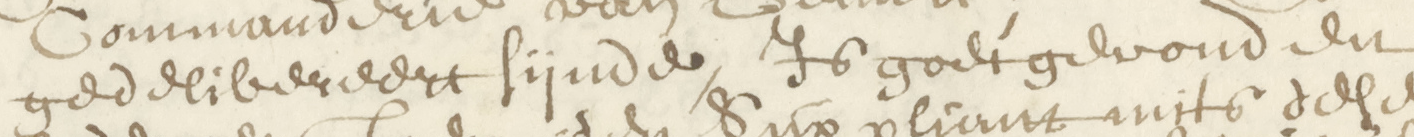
gedelibereert sijnde, Is goetgevonden
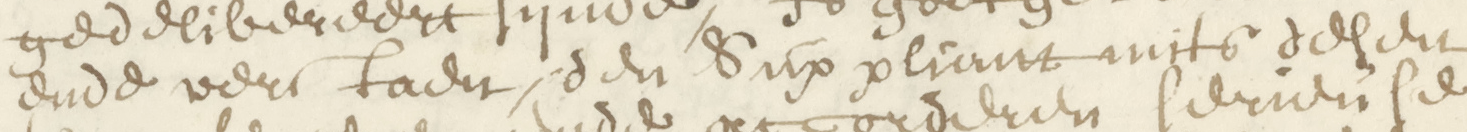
ende verstaen, den Suppliant mits desen
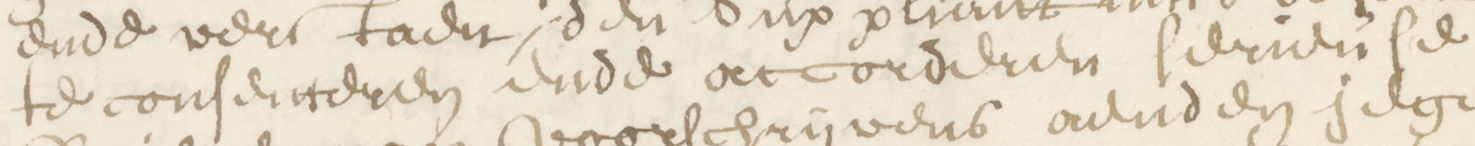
te consenteren ende accorderen serieuse
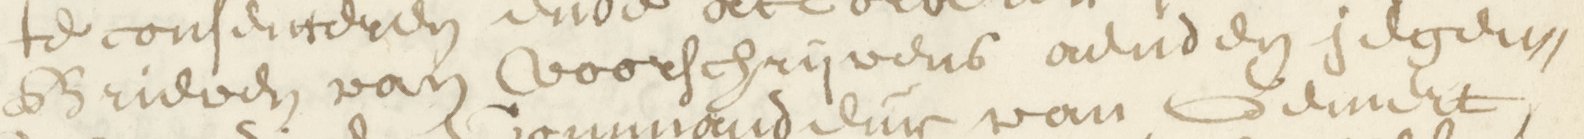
Brieven van voorschrijvens aenden jegen„
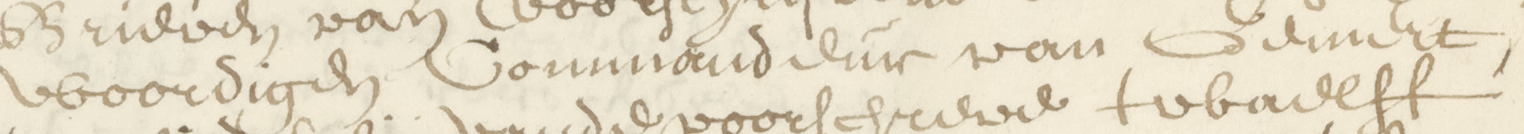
woordigen Commandeur van Gemert,
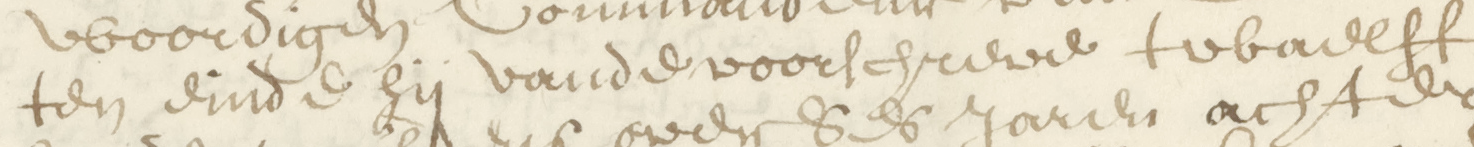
ten einde hij vande voorschreve twaelff
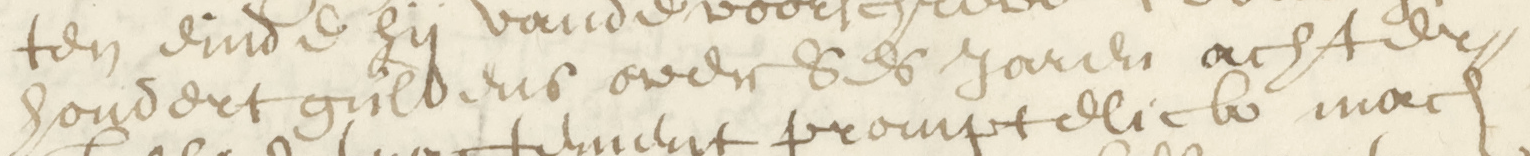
hondert guldens over Ses Jaren achter„
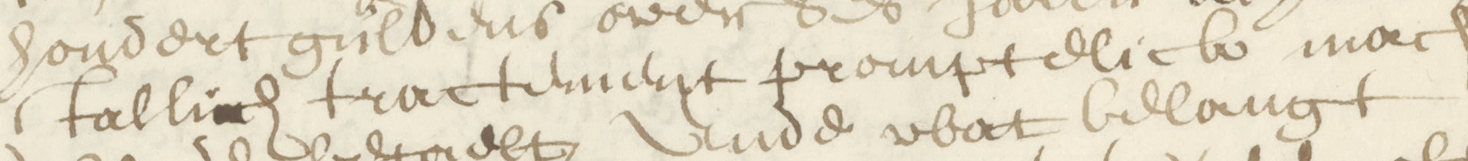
stallich tractement promptelick mach
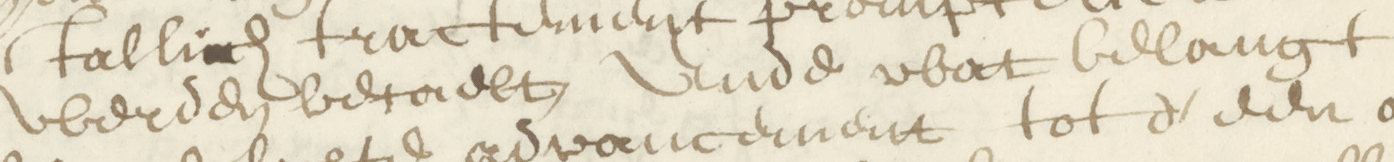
werden betaelt, Ende wat belangt
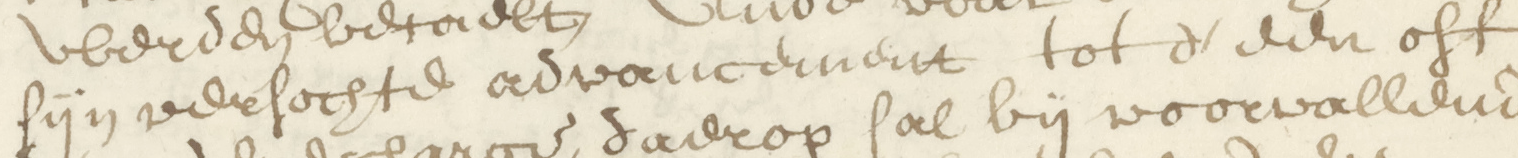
sijn versochte advancement tot d‛een off
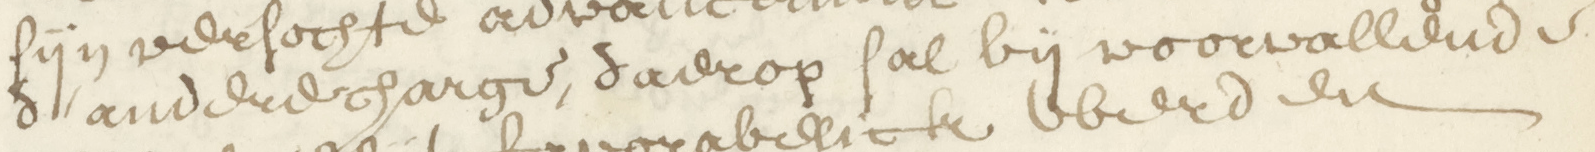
d‛andere charge, daerop sal bij voorvallende
